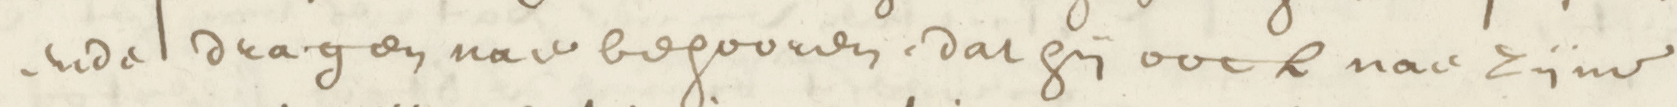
ende dragen nae behooren, dat hij oock nae zijne
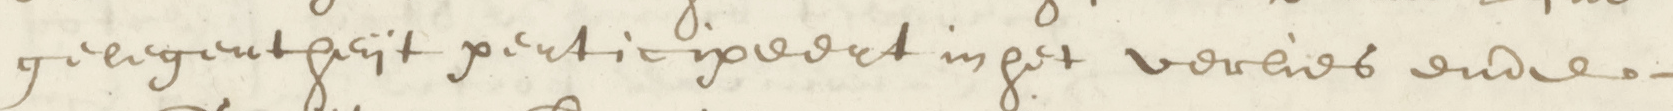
gelegentheijt perticipeert in het verlies ende
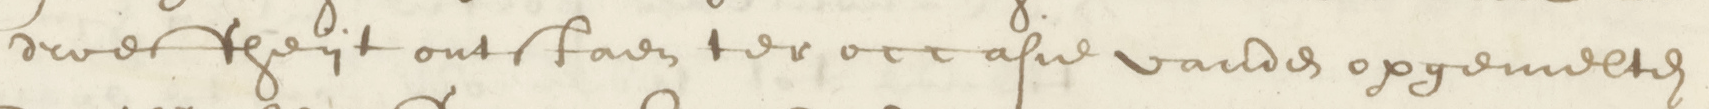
droeffheijt ontstaen ter occasie vanden opgemelten
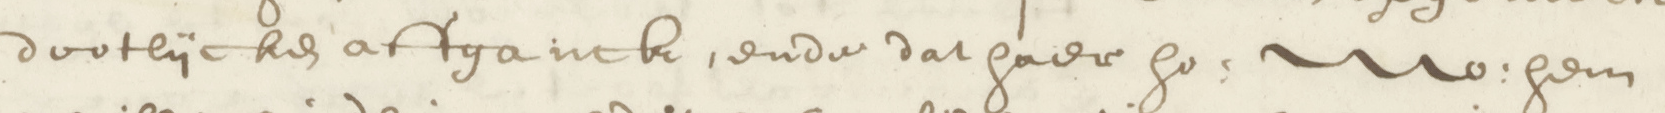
dootlijcken affganck, ende dat haer ho:Mo: hem
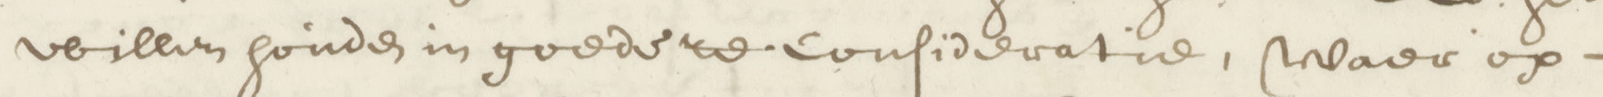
willen houden in goede re consideratie. Waer op
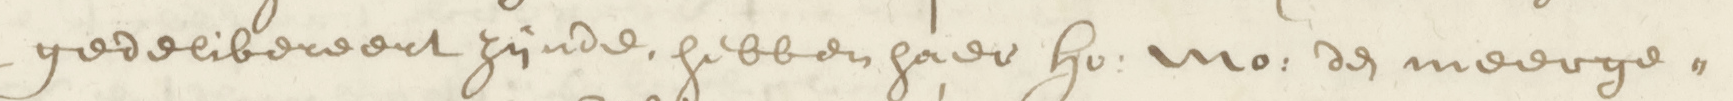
gedelibereert zijnde, hebben haer Ho:Mo: den meerge„
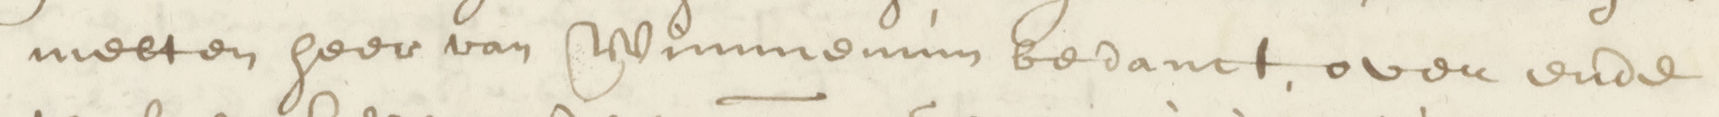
melten heer van Wimmenum bedanct over ende
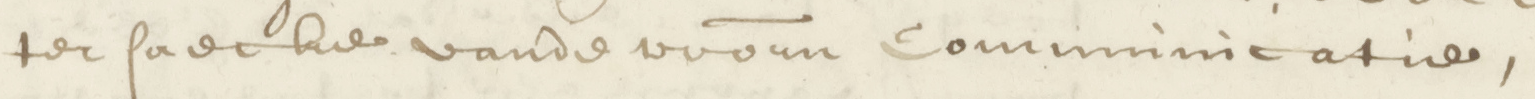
ter saecke vande voorn Communicatie,
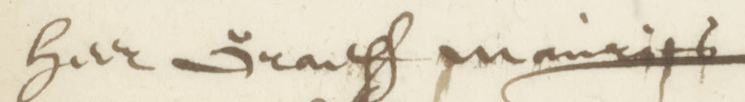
heer Graeff maurits
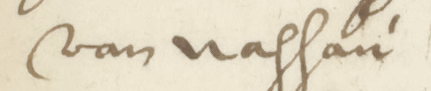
van Nassau
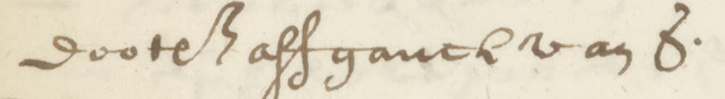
Dootl affganck van S.
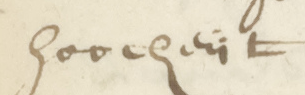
hoocheijt
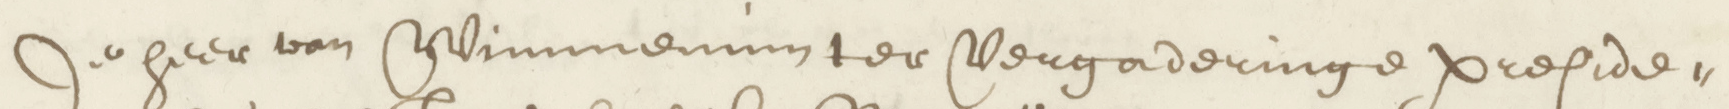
De heer van Wimmenum ter Vergaderinge Preside„
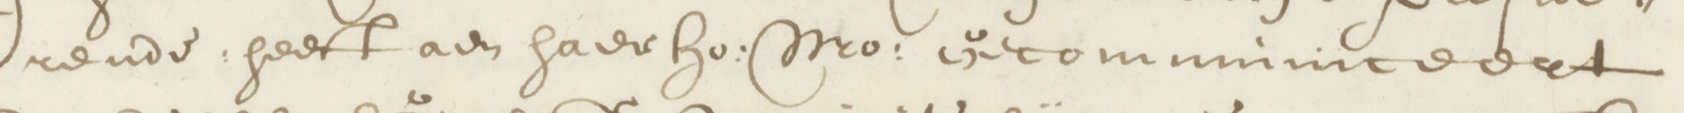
rende heeft aen haer Ho:Mo: Gecommuniceert
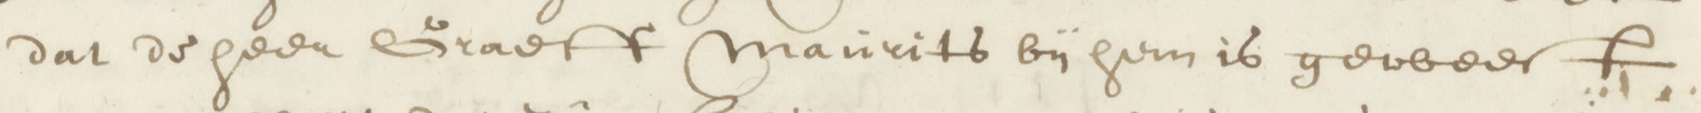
dat de heer Graeff Maurits bij hem is geweest
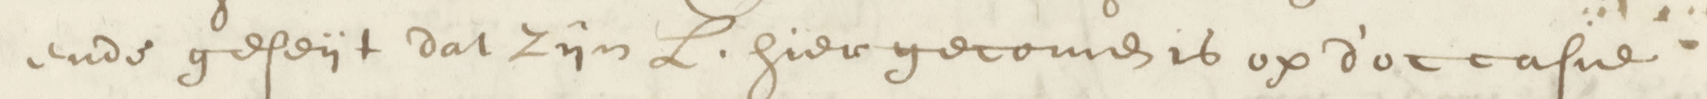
ende geseijt dat zijn L. hier gecomen is op d‛occasie
